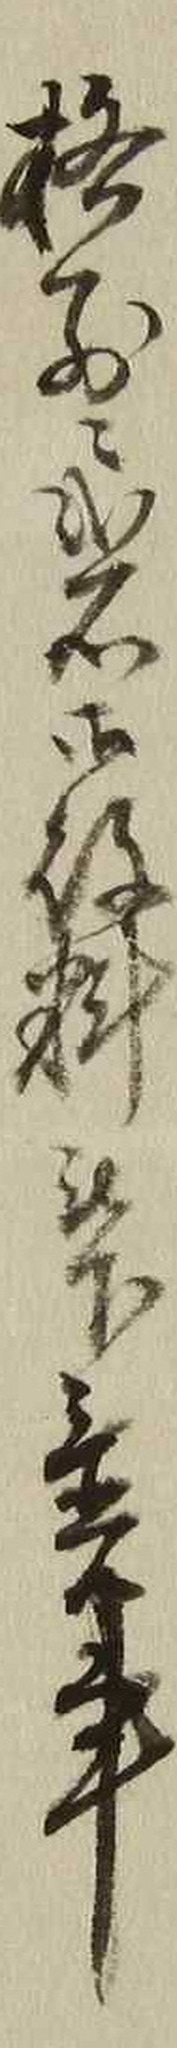格別に弐石御役料被下置候事
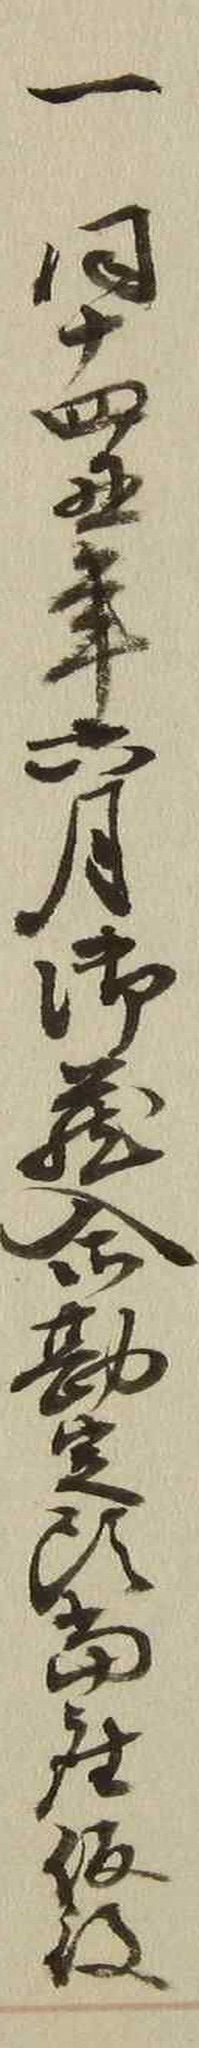一同十四年丑年六月御蔵入御勘定頭当座仮役
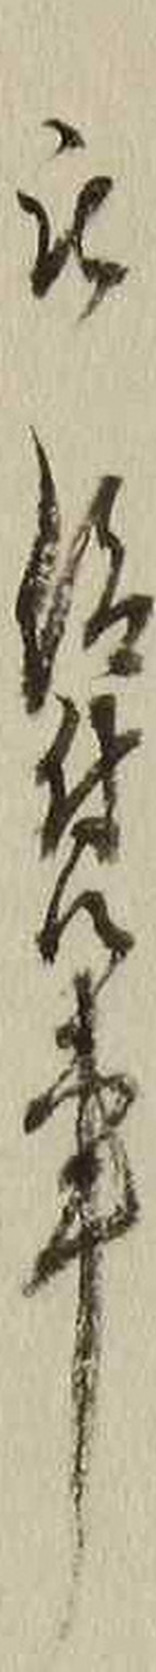被仰付候事
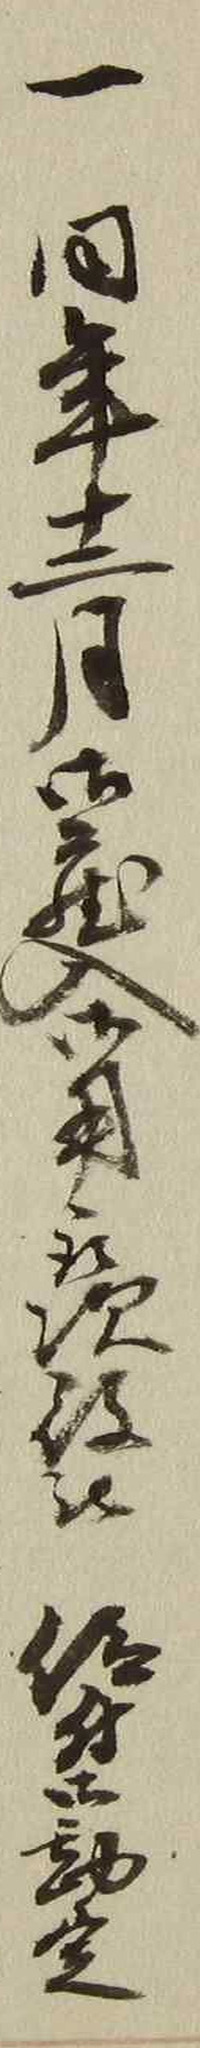一同年十二月御蔵入御用取次役被仰付御勘定
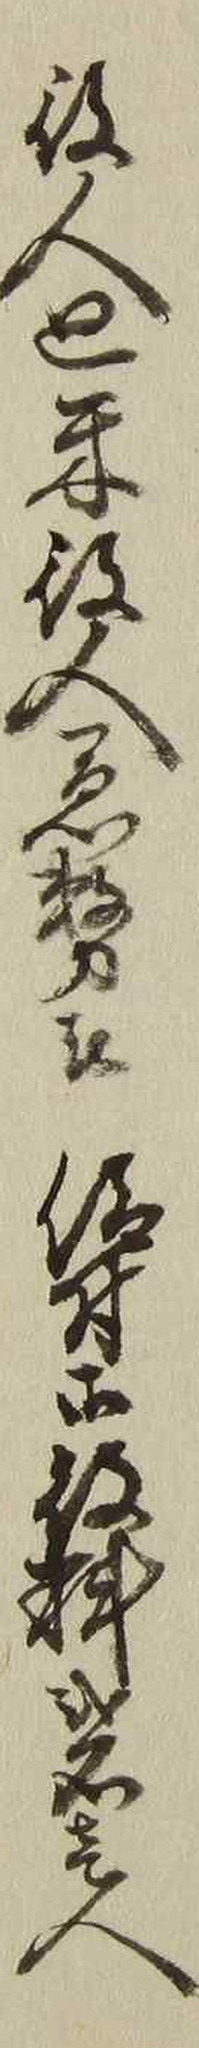役人廻米役人兼務被仰付御役料弐石壱人
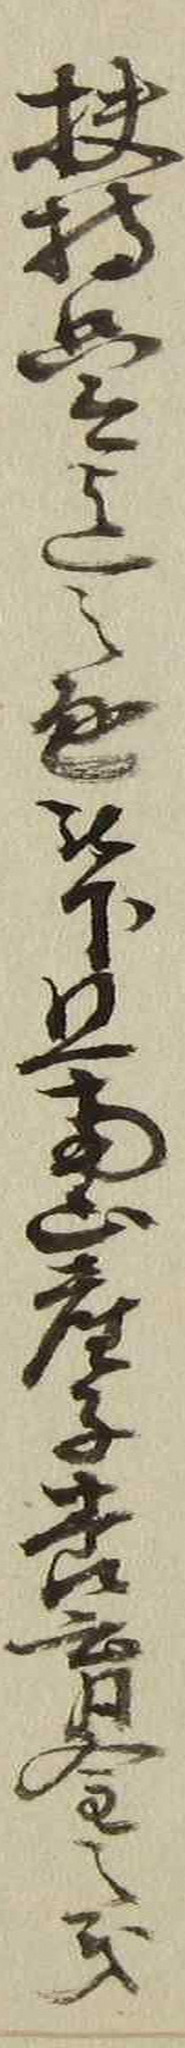扶持只今迄之通被下且南山産子養育金之義
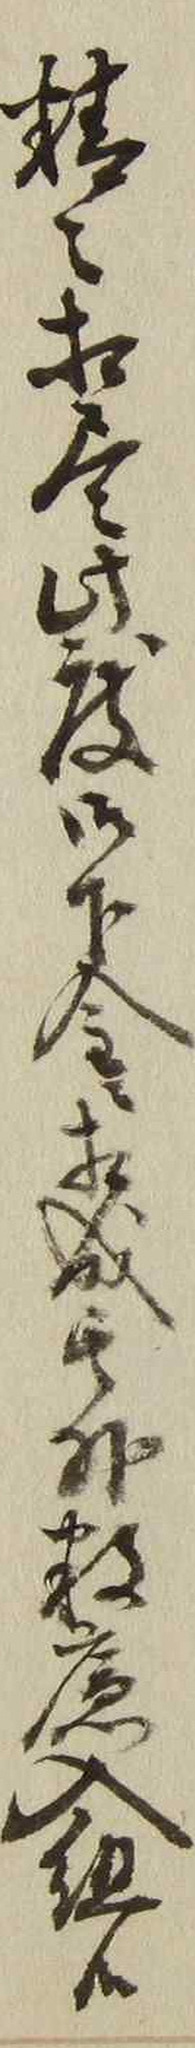精々相尽此度御下金に相成其外数廉入組候
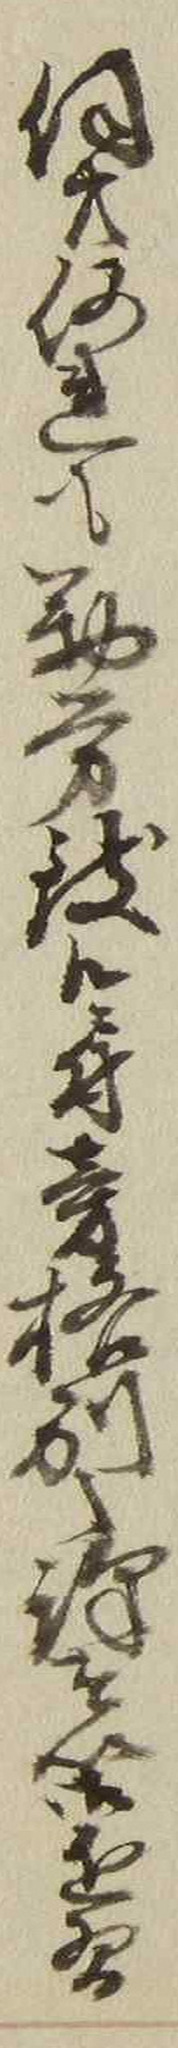伺共何れも勤労致候に付旁格別之訳を以御近習
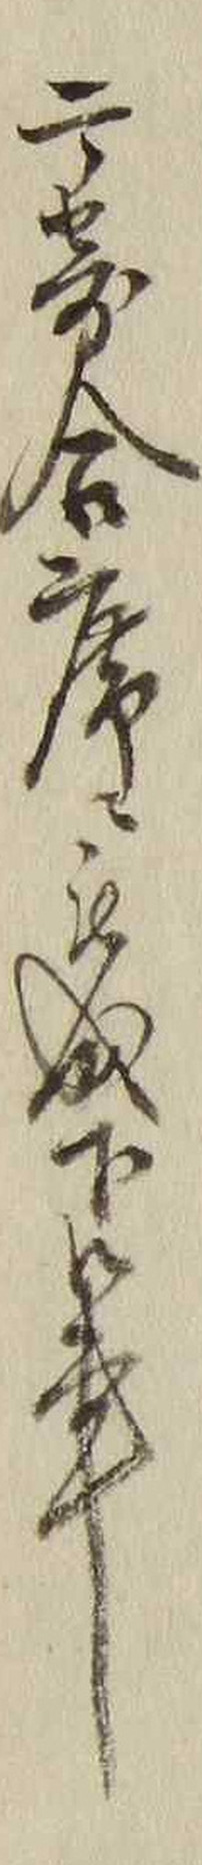二ノ寄合席に被成下候事

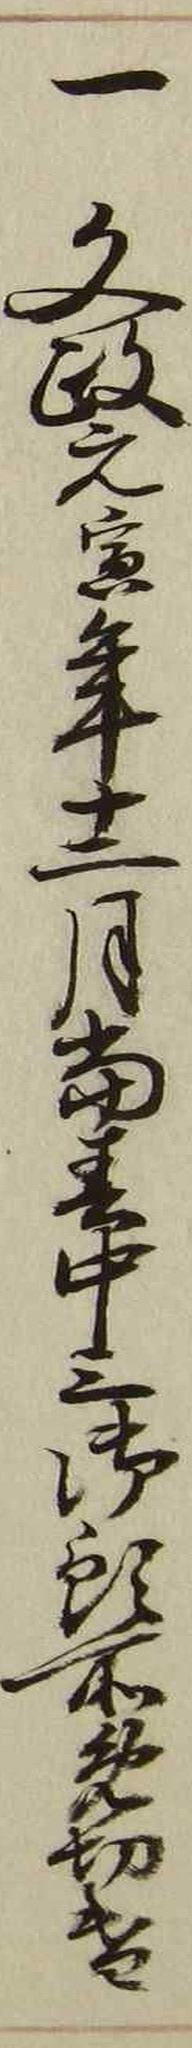一文政元寅年十二月当春中三御預所免切替
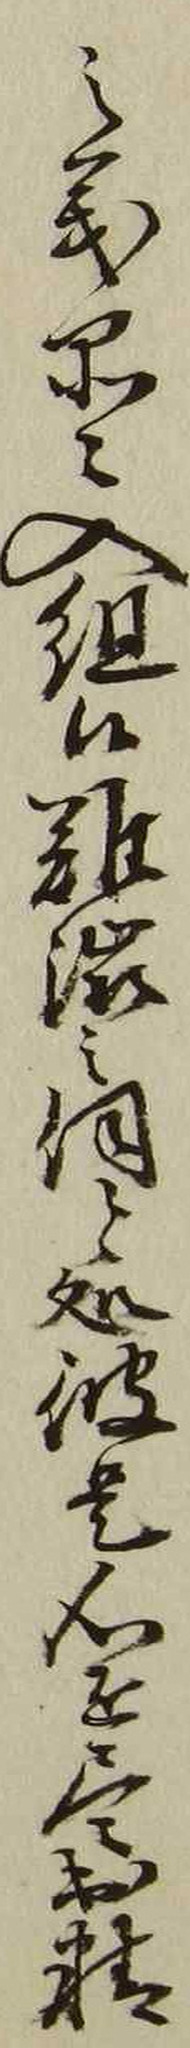之義品々入組候難渋之伺に候処彼是心を尽出精
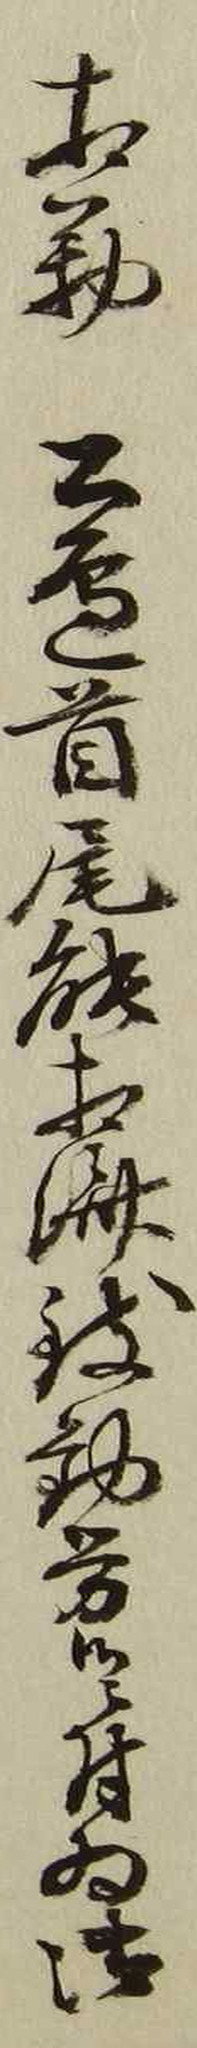相勤公辺首尾浴能相済致勤労候に付為御
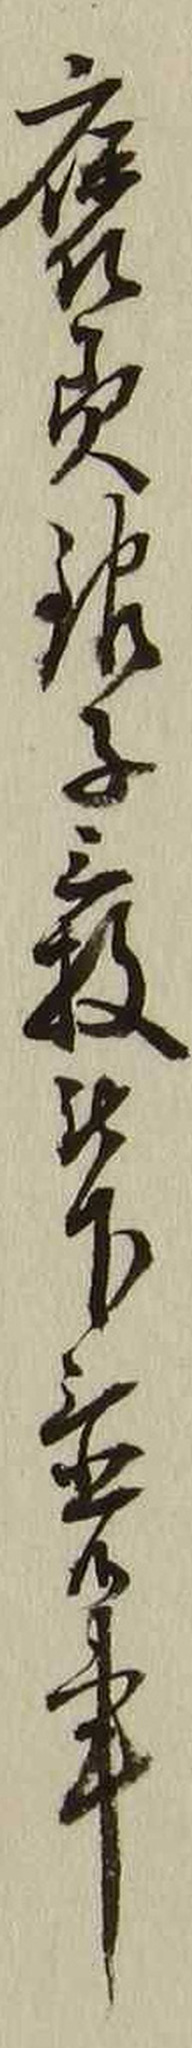褒美銀子三枚被下置候事
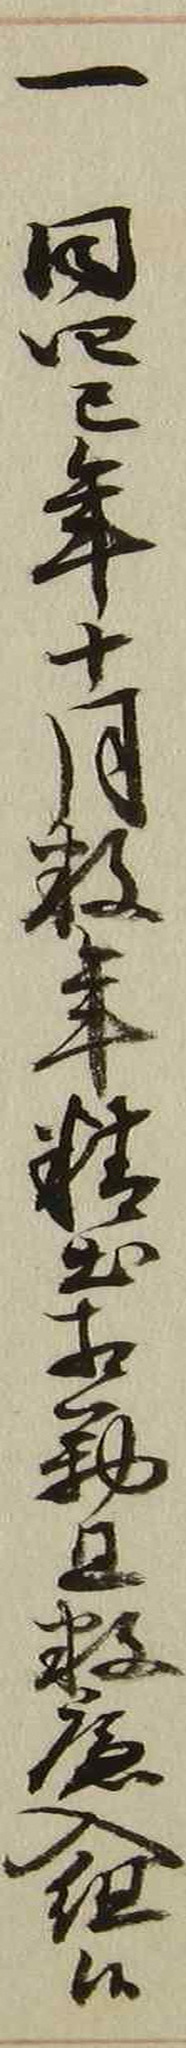一同四年巳年十月数年精出相勤且数廉入組候
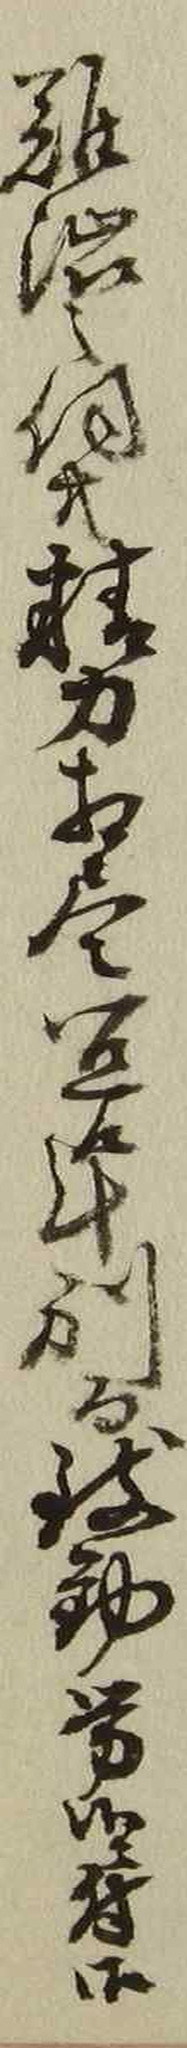難渋之伺共精力相尽宜取計別而致勤労候に付御
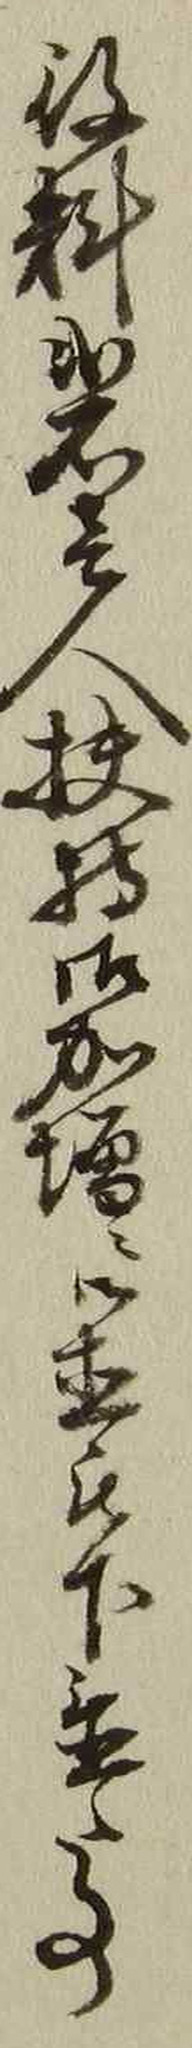役料弐石壱人扶持御加増に御直被下置候事
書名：諸士系譜　巻之38　は之部6
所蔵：会津若松市立会津図書館
